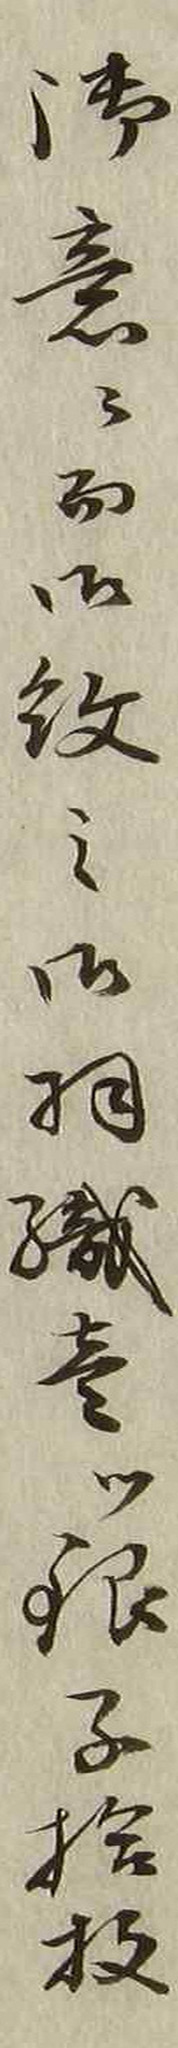御意ニて御紋之御羽織壱銀子拾枚
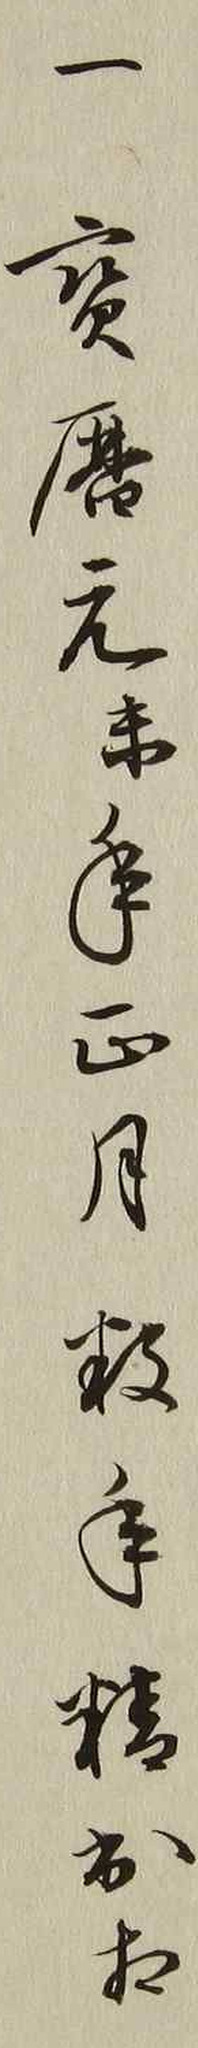一宝暦元未年正月数年精出し相
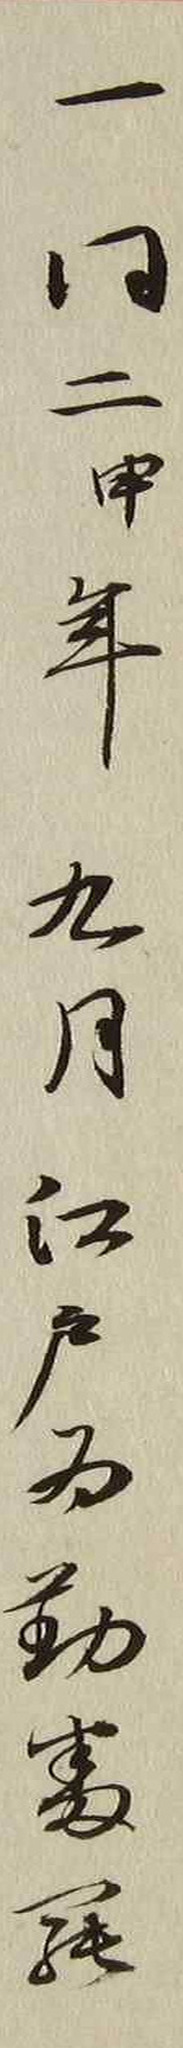一同二申年九月江戸勤番之為罷り
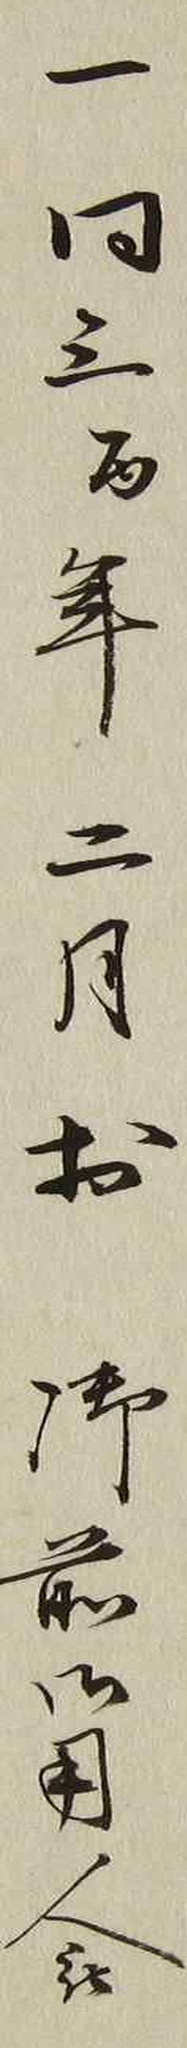一同三酉年二月御前ニ於いて御用人
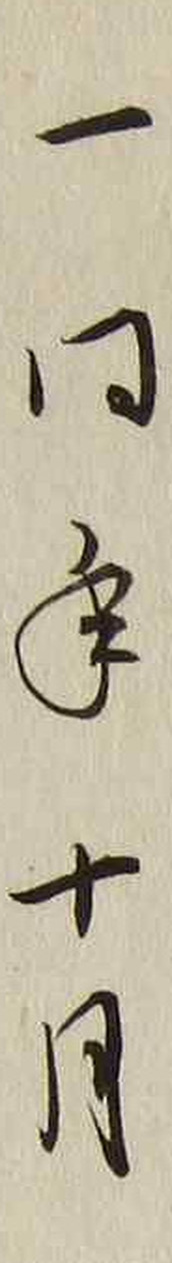一同年十月
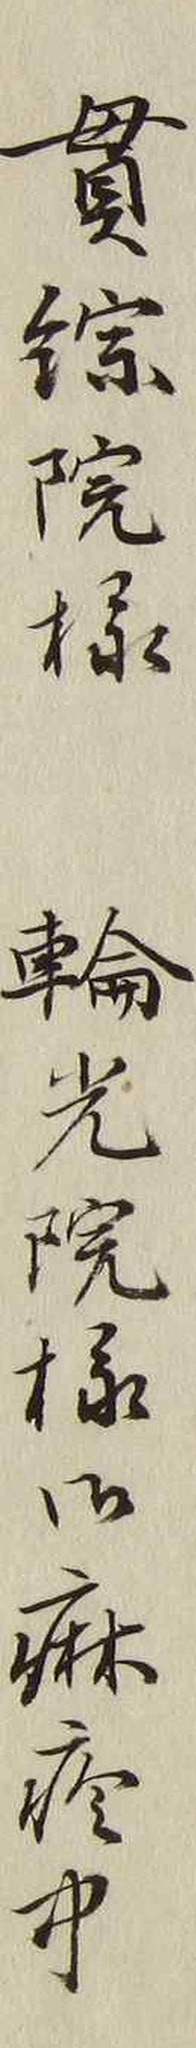貫綜院様輪光院様御麻疹中

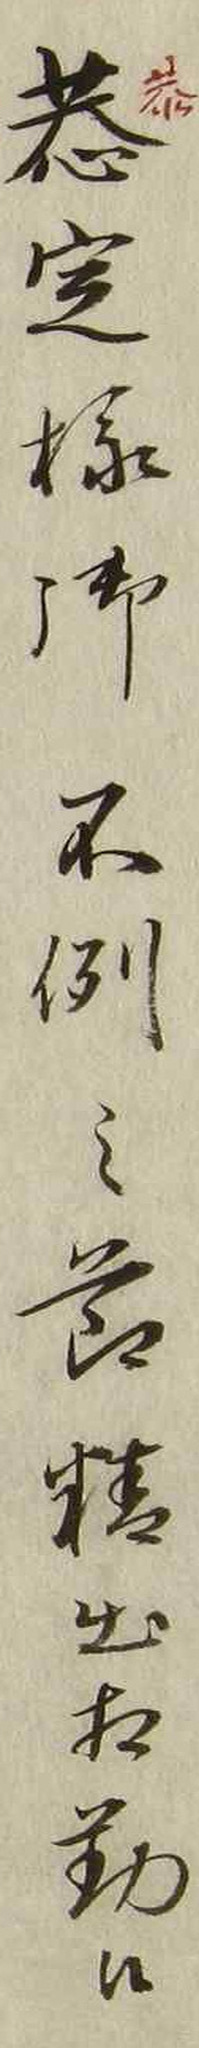恭定様御不例之節精出し相勤候
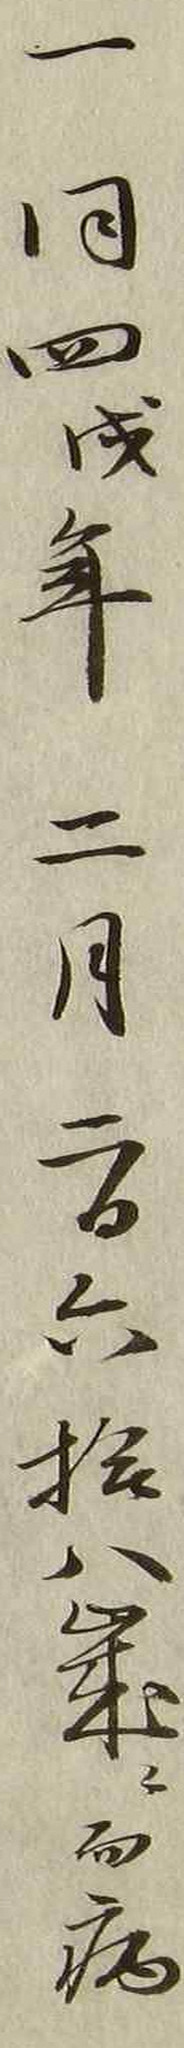一同四戌年二月二日六拾八歳ニて病
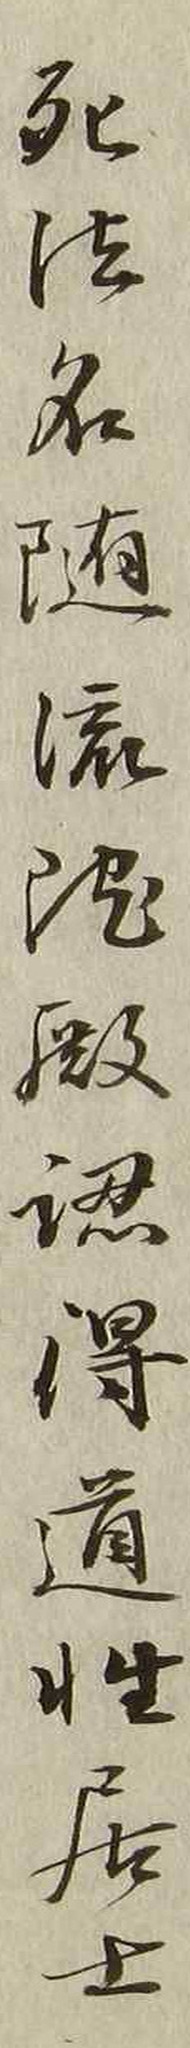死法名随流院殿認得道性居士
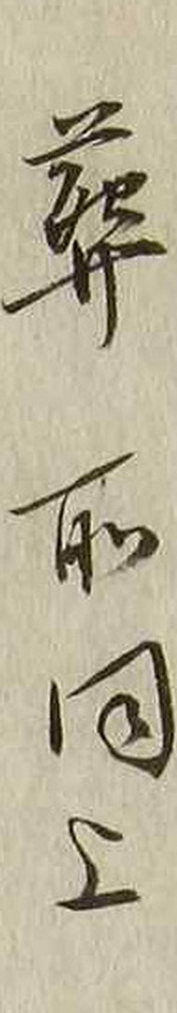葬所同上
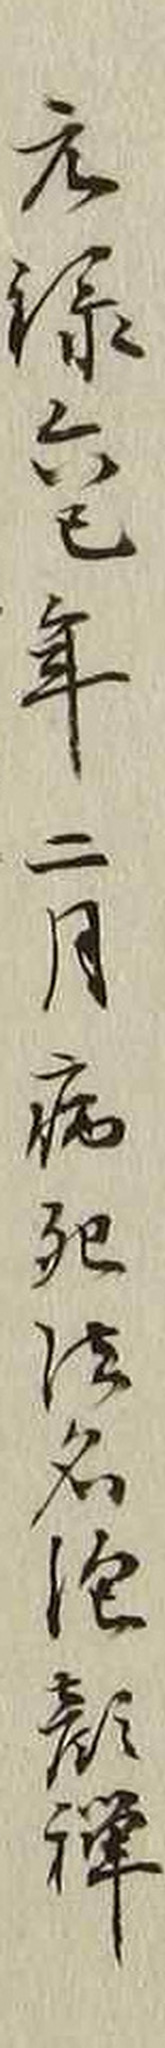半弥元禄六巳年二月病死法名抱顔禅
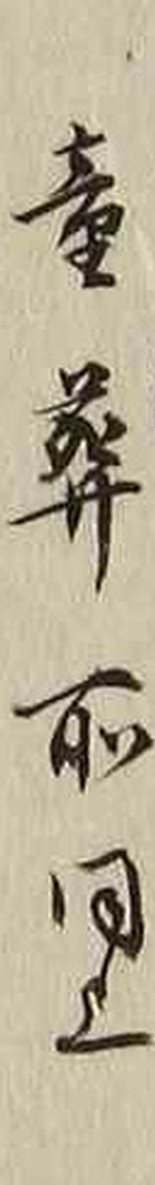童葬所同上
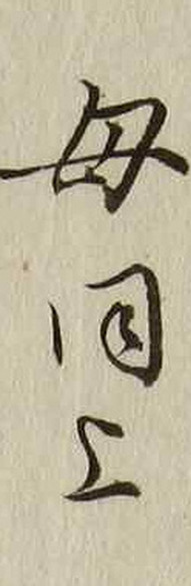母同上
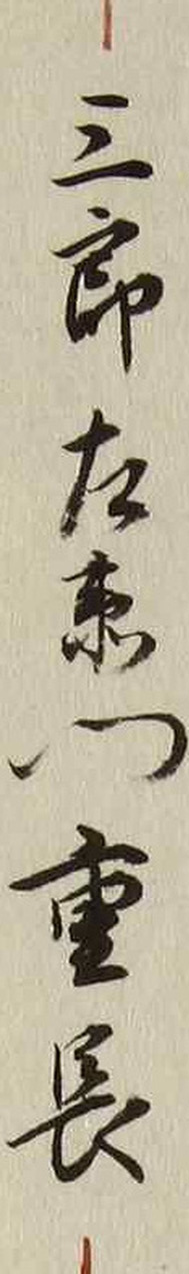三郎左衛門重長
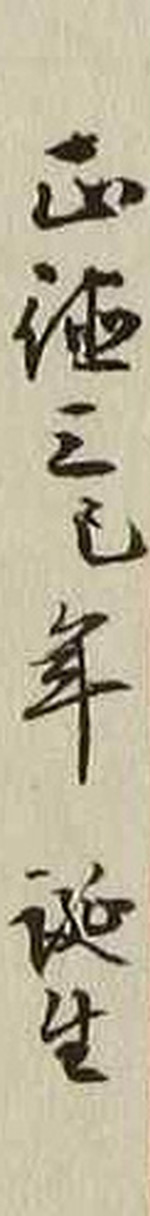正徳三巳年誕生
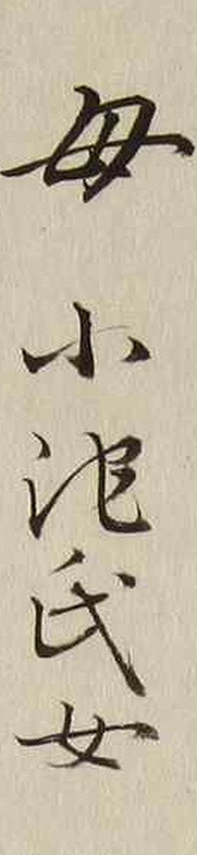母小池氏女
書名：諸士系譜　巻之16　い之部16
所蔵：会津若松市立会津図書館
